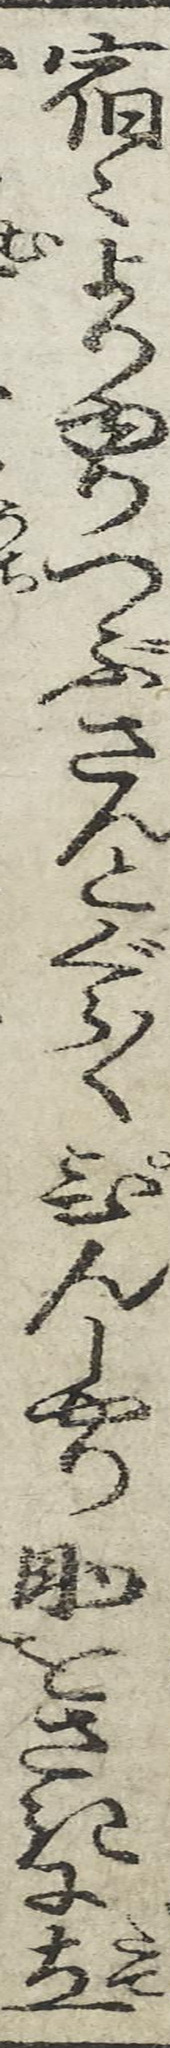宿〻よりゆりつぶさんとぐら〳〵ぴんしやり助をさきに立
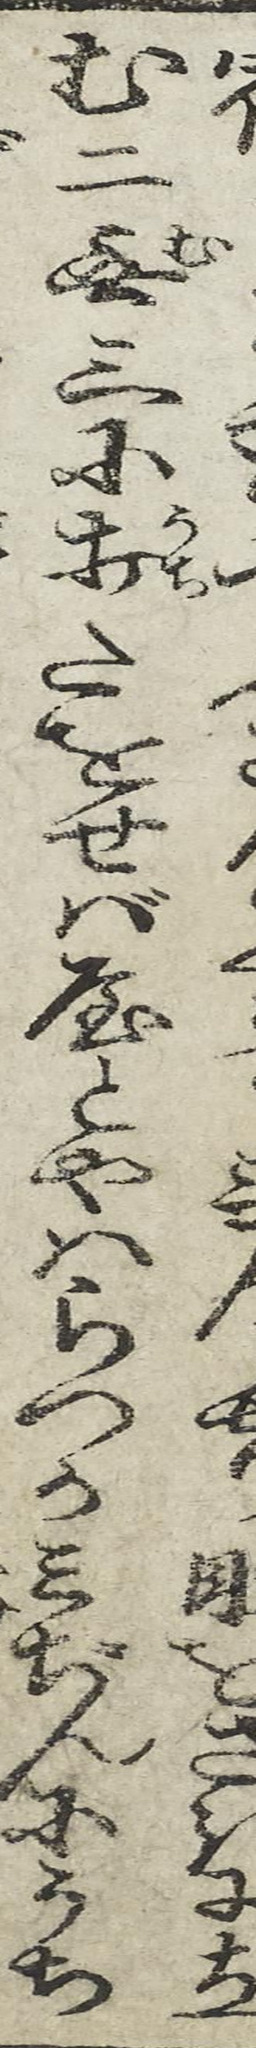む二無三に打たをせばやとやはらつかみぢんにうち
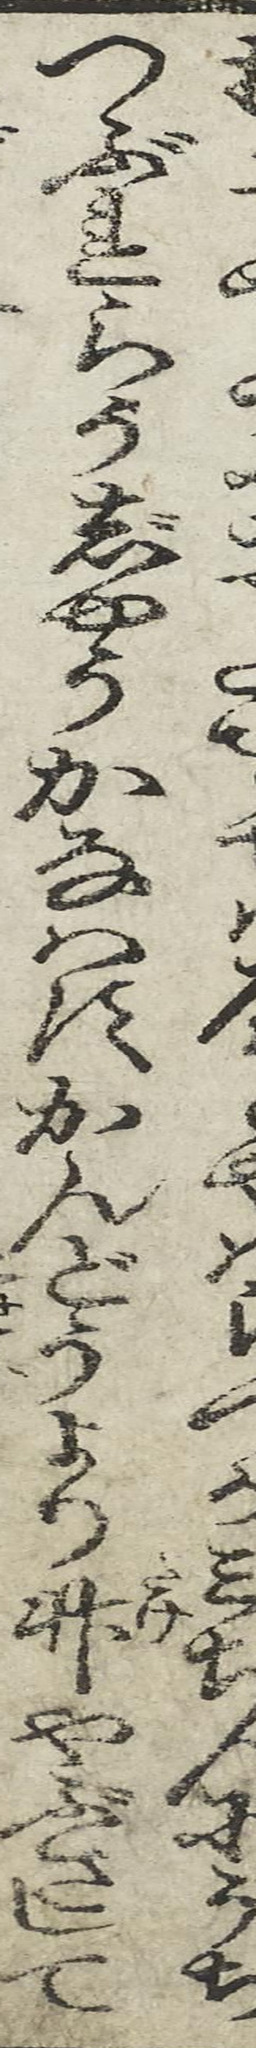つぶれらうじやうかなはすかんどうより竹やぶさして
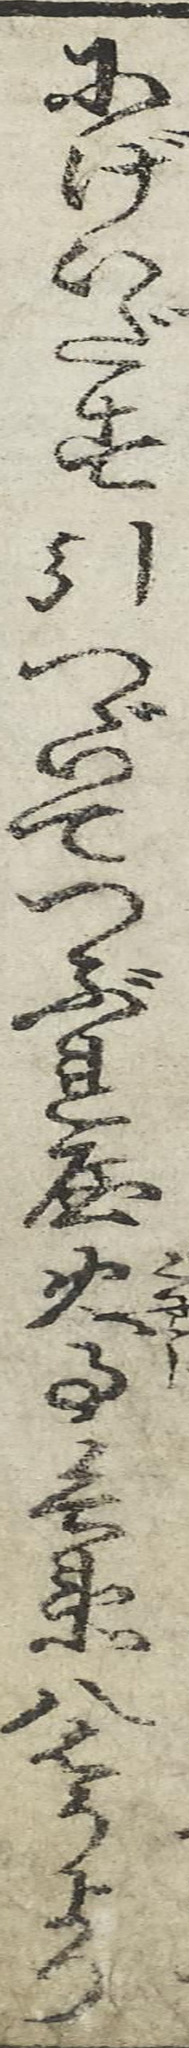にげいだす引つゞいてつぶれ屋火事兵衛八はうより
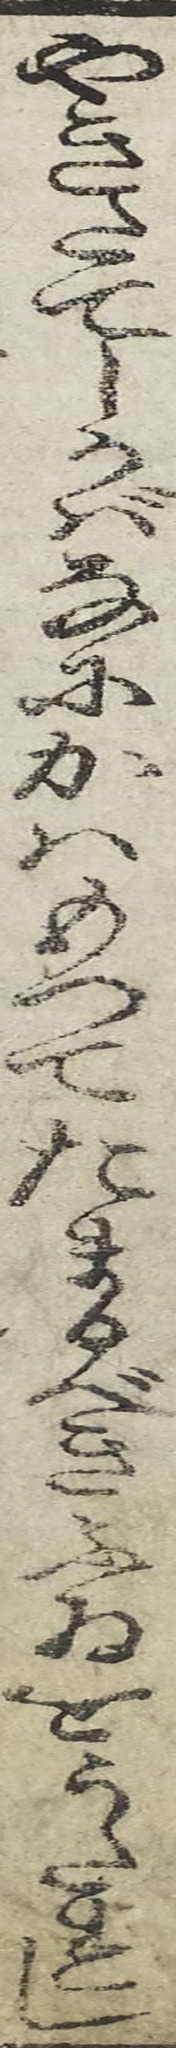やきたてしかばなにかはもつてたまるべきふゐをうたれし
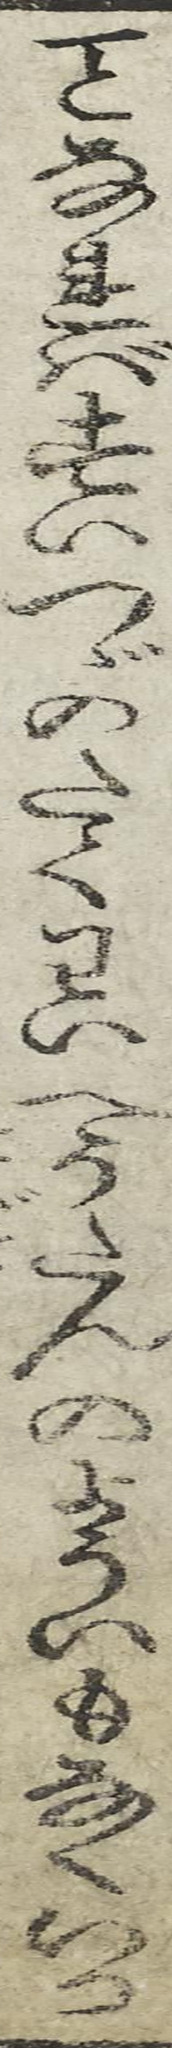ことなればすいつゞのたくわいへうたんのよういもなくいか
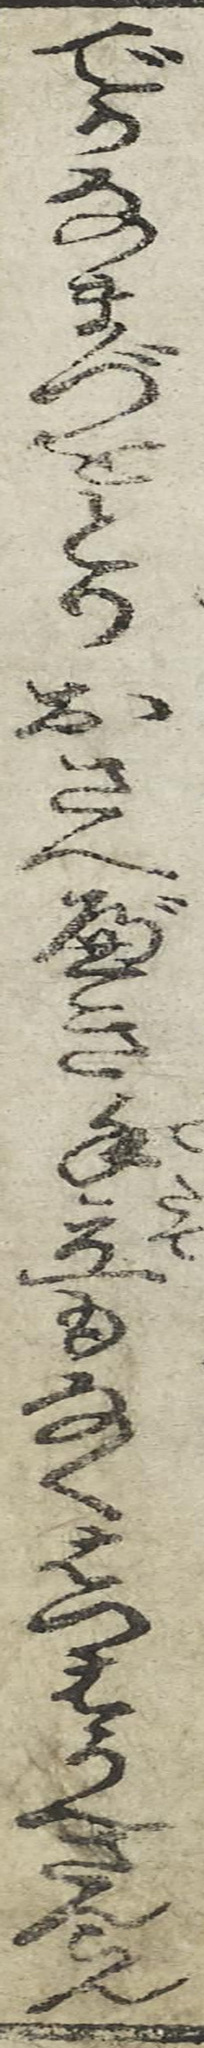でかなまづをとりおさへべき手立もなくはつはうへさんらん

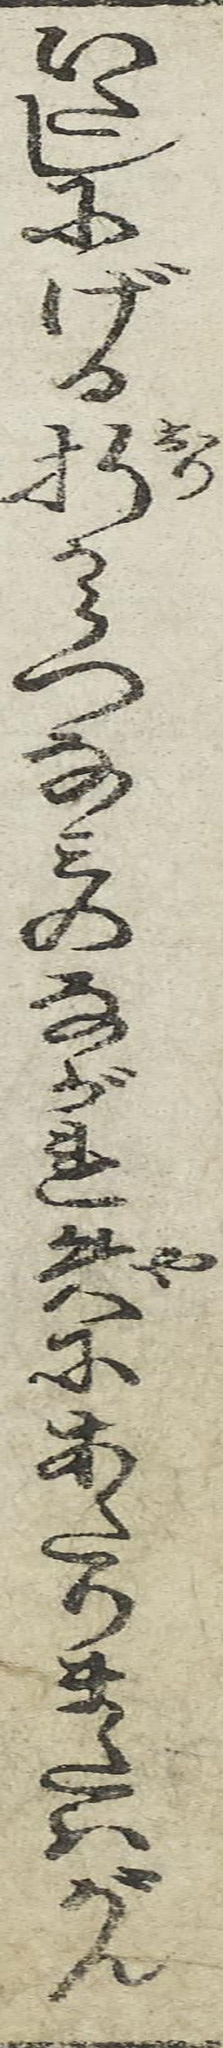いたしにげる折からつなみのながれ矢にあたりまたはがん
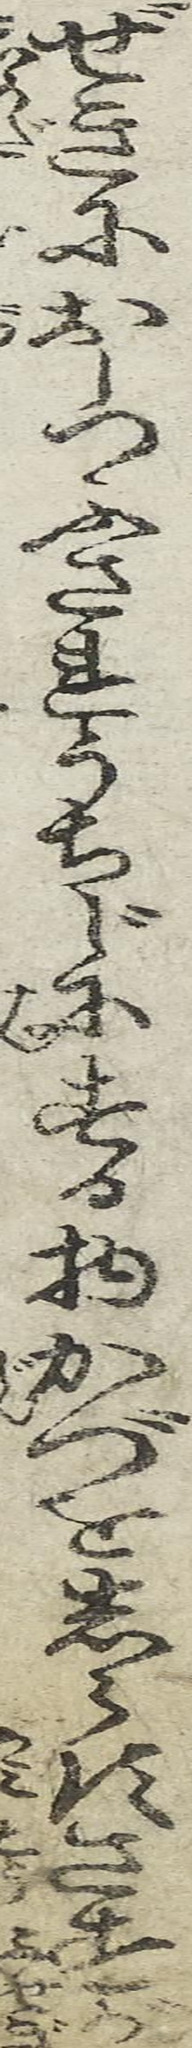ぜきにおしつふされうちじにする物かづをしらすさすが
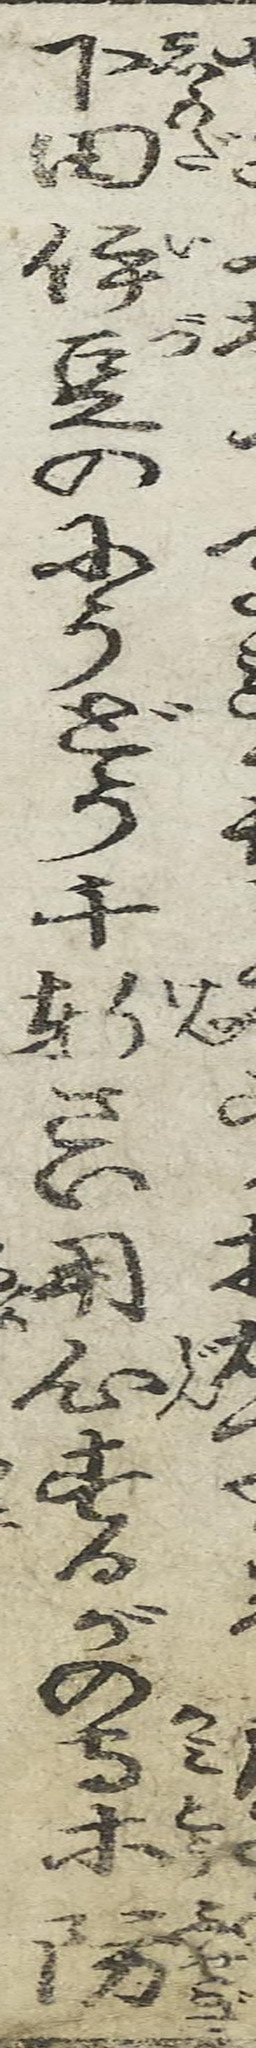下田伊豆のにうどう千軒さい用心するがの守等防
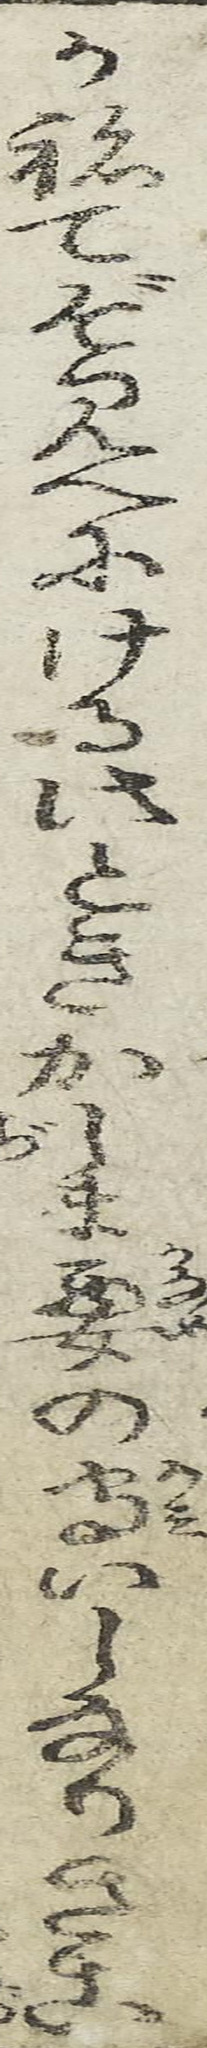かねてぞ見へにける此ときかしま要の守いしなりきこ
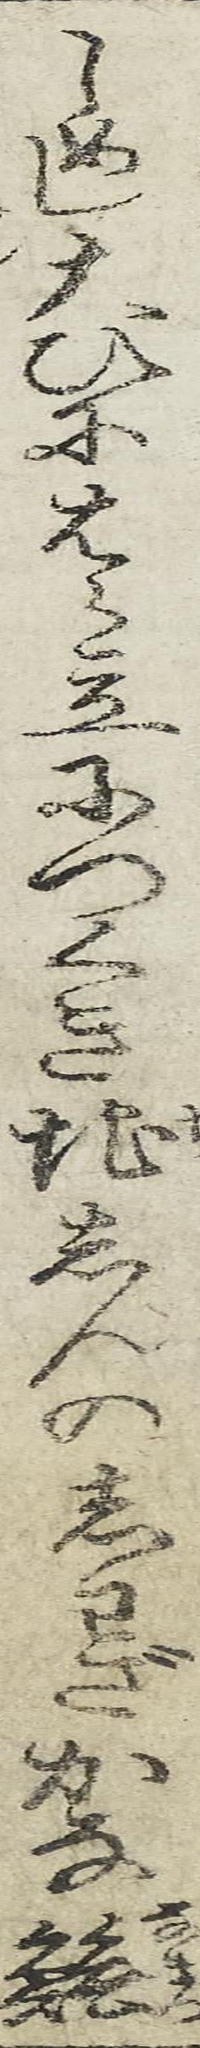しめし大ひにはら立につくき地しんのしわざかな鯰
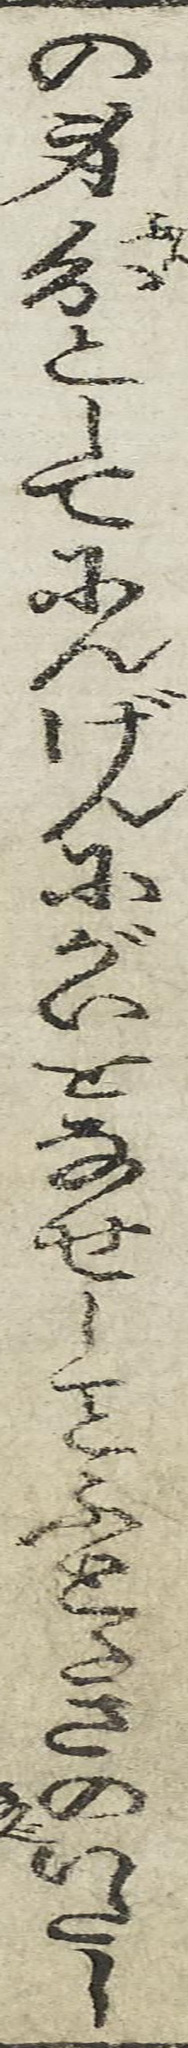の身分としてにんげんにがいをなせしことふとゝきのいたし
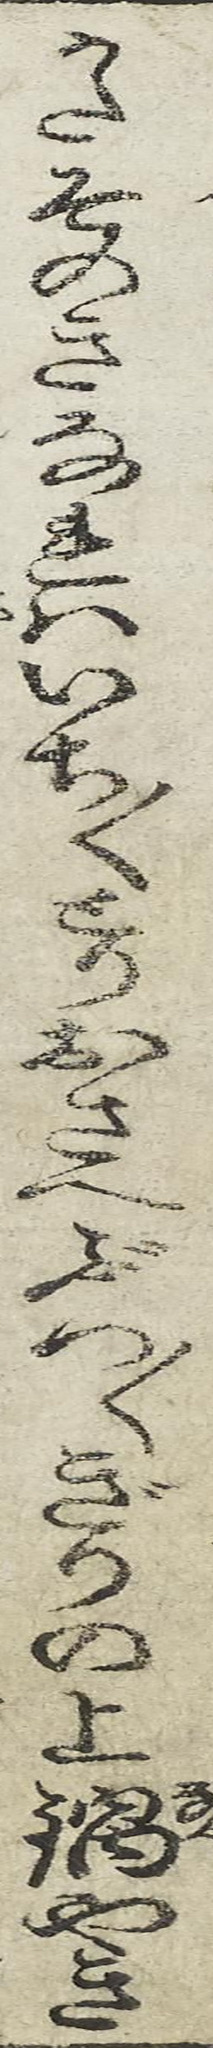かたそのきなれはいち〳〵とりおさへぶつ〳〵ぎりの上鍋やき
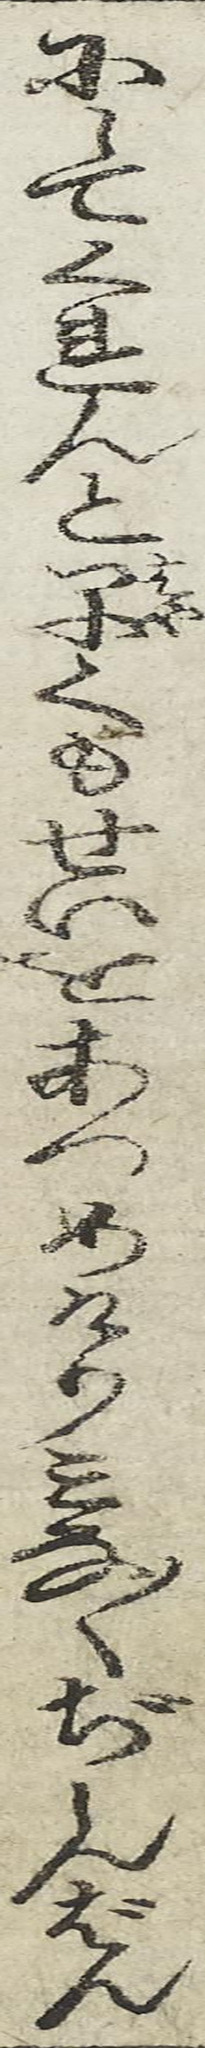にしてくれんと早くもせいをあつめけりみな〳〵ぢしんばん
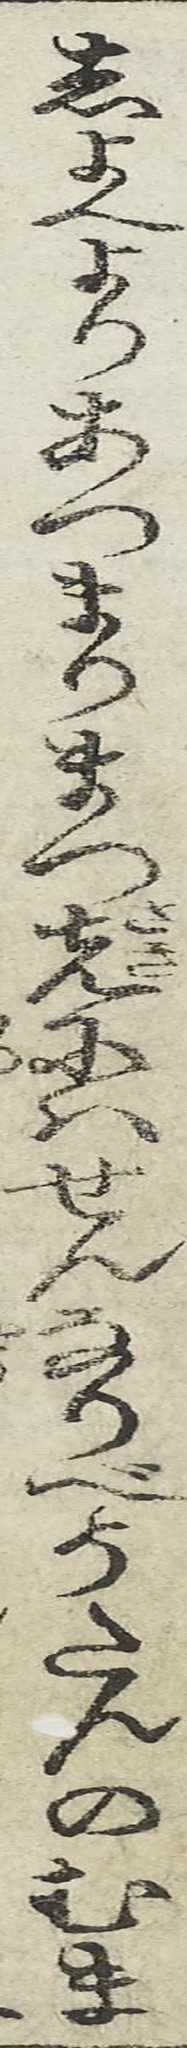しよ人よりあつまりまつ先にはせんなりべうたんのむま
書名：新板ぢしん太平記
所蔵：東京大学地震研究所図書室 Earthquake Research Institute Library, The University of Tokyo, JAPAN
